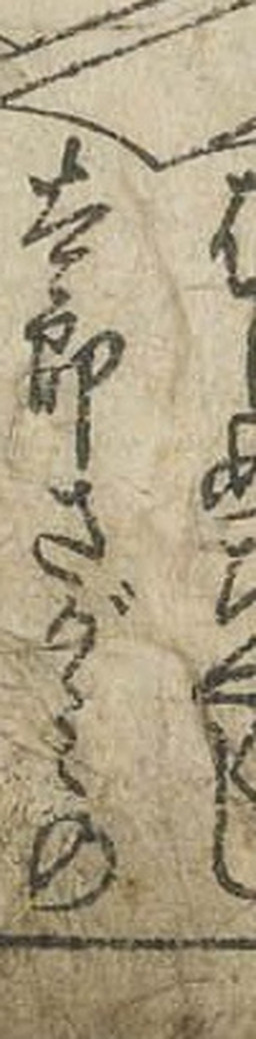太郎さがみの
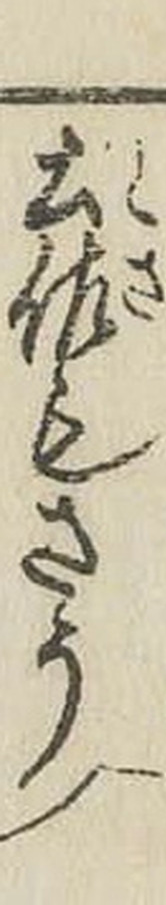土佐もさう
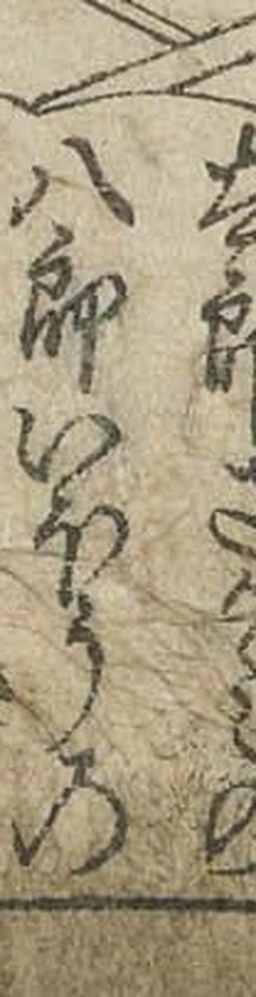八郎いほうの
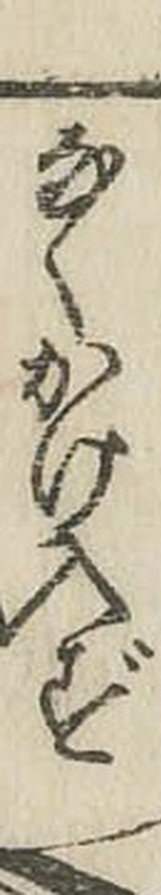なくかけ入ず
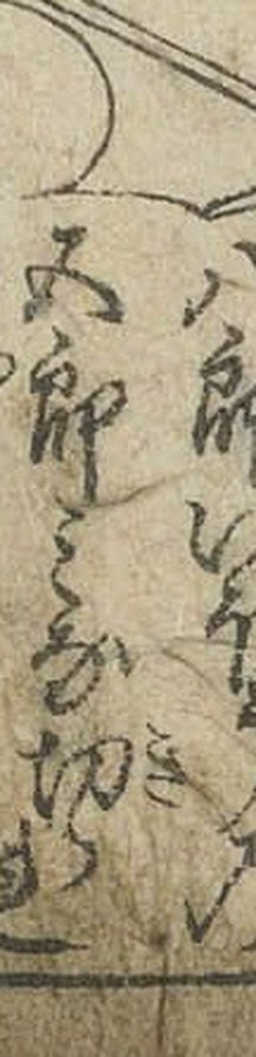五郎みな切られ
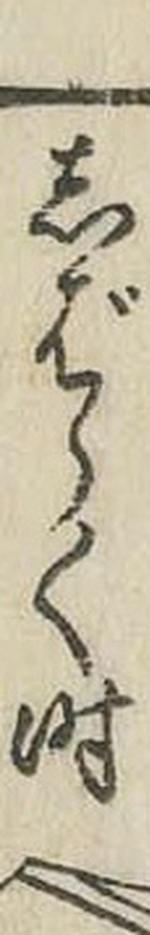しばらく時
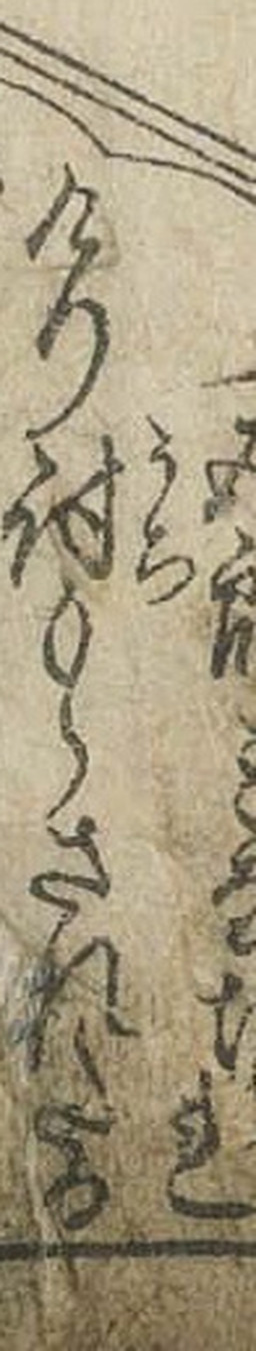けり討もらされたる
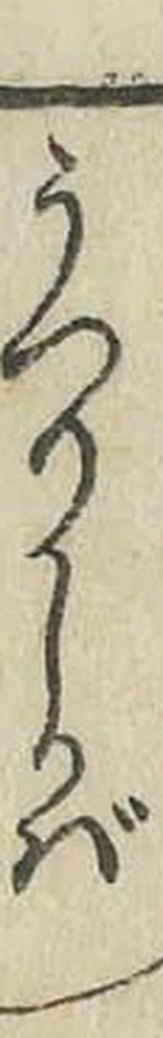うつりしかば
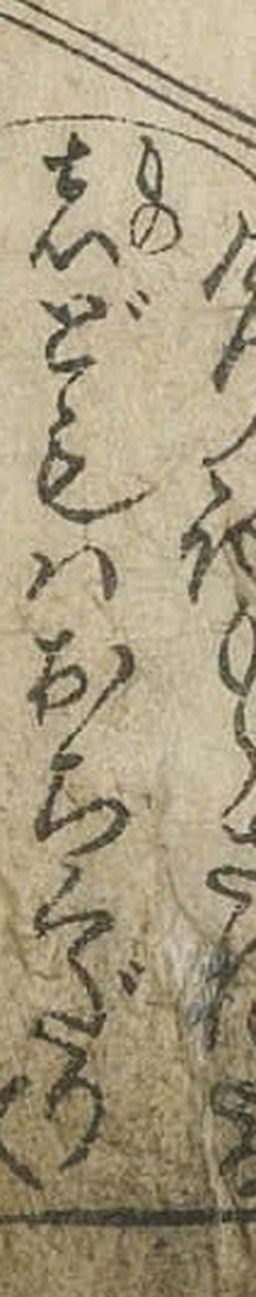者どもはおちくだりて
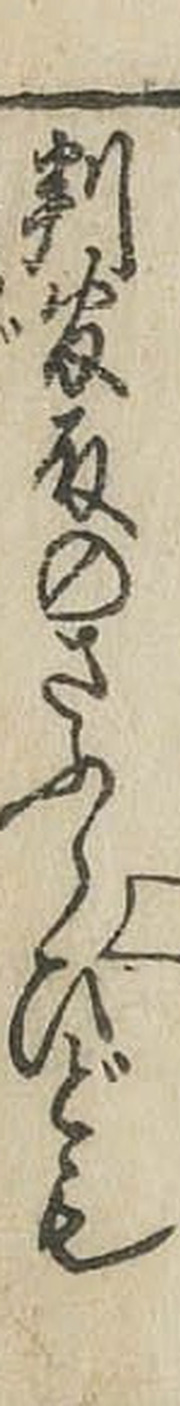判官殿のさふらひども
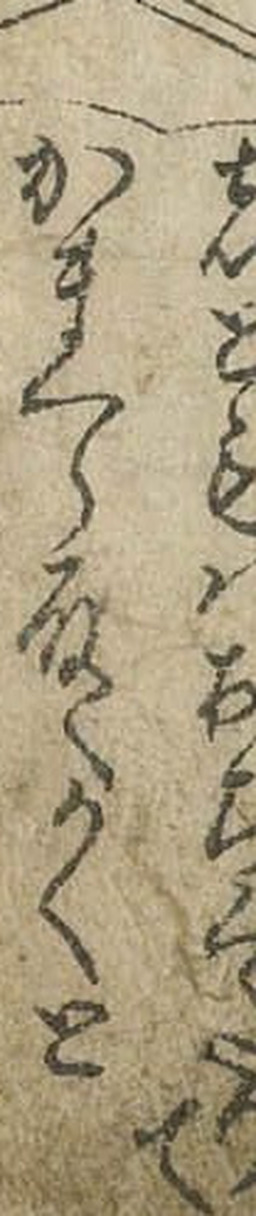かまくら殿へかくと
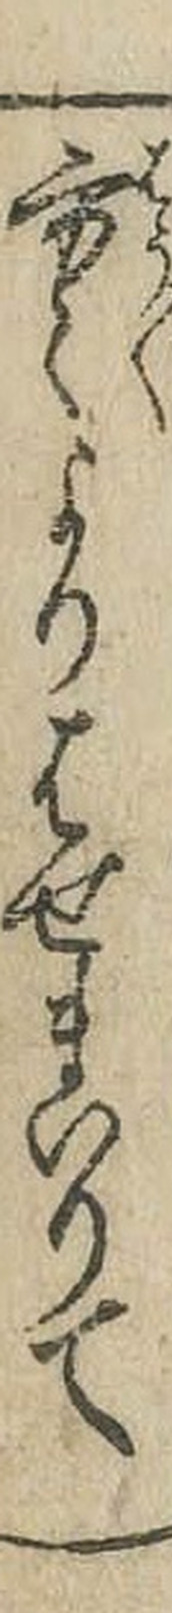方々よりはせまいりて
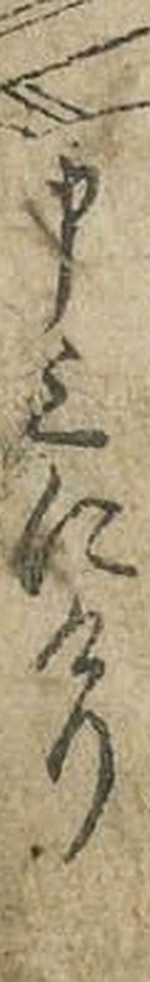申上にけり

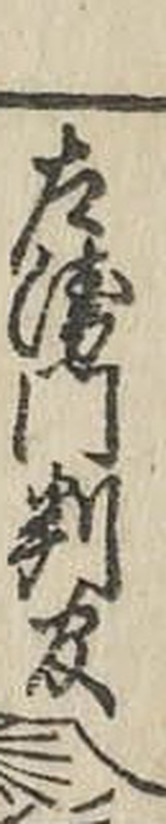左衛門判官
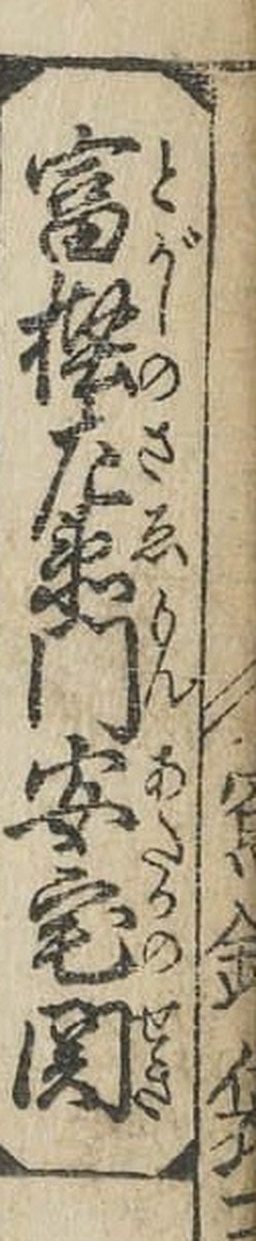富樫左衛門安宅関
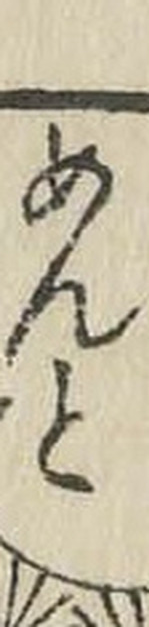めんと
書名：絵本写宝袋 9巻 3之巻
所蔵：東京学芸大学教育コンテンツアーカイブ
